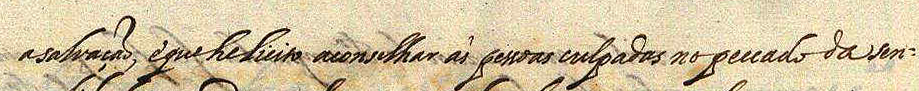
a salvação, e que he licito aconselhar as pessoas culpadas no peccado da sen
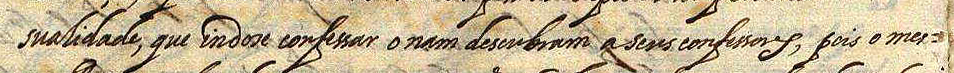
sualidade, que indose confessar o nam descubram a seus confessores, pois o mes
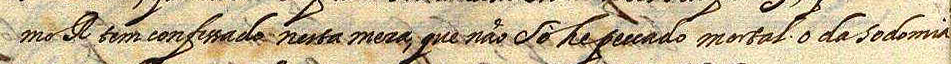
mo R tem confessado nesta meza, que naõ so he peccado mortal o da sodomia
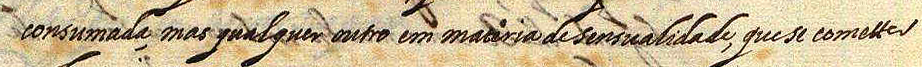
consumada, mas qualquer outro em materia de sensualidade, que se cometter
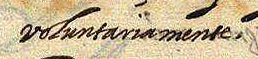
voluntariamente.
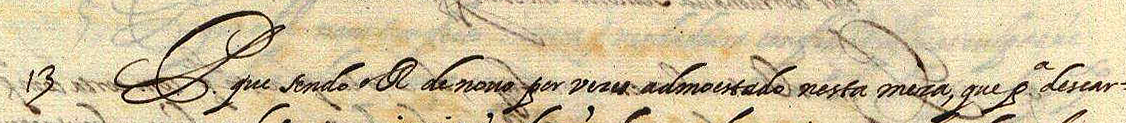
13 P. que sendo o R de nouo por vezes admoestado nesta meza, que pa descar
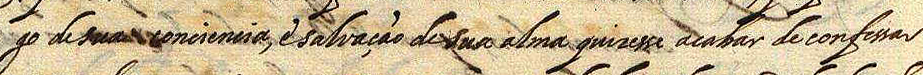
go de sua conciencia, e salvação de sua alma quizesse acabar de confessar
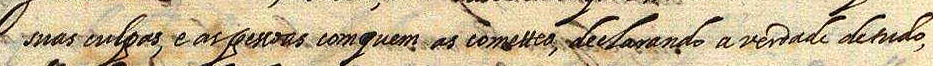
suas culpas, e as pessoas com quem as cometteo, declarando a verdade de tudo,
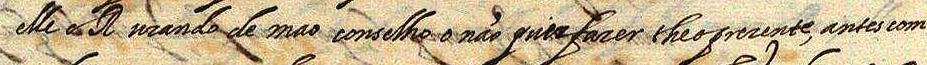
elle o R uzando de mao conselho o naõ quiz fazer the o prezente, antes com
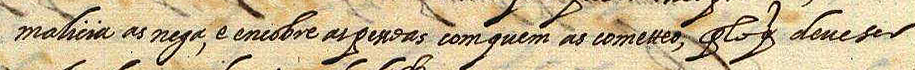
malicia as nega, e encobre as pessoas com quem as cometteo, plo q̄ deue ser
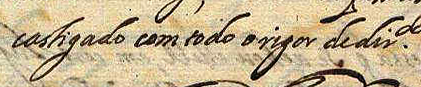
castigado com todo o rigor de dir.to
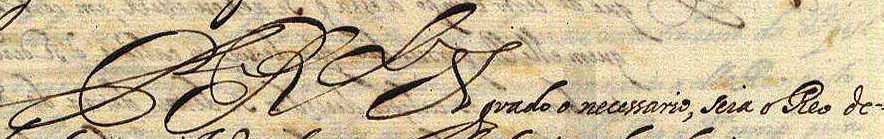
P Rto & ꝓvado o necessario, seia o Reo de
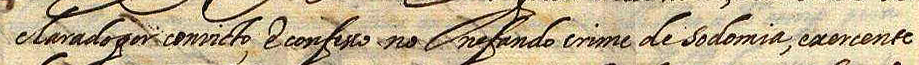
clarado por convicto, e confesso no nefando crime de sodomia, exercente
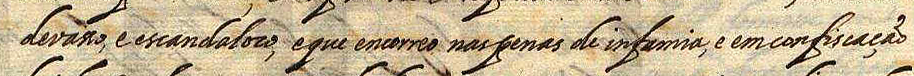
devasso, e escandalozo, e que encorreo nas penas de infamia, e em confiscaçaõ
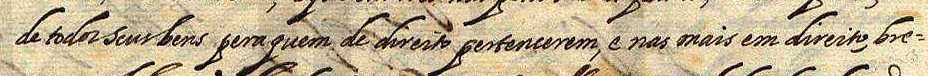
de todos seus bens pera quem de direito pertencerem, e nas mais em direito, bre
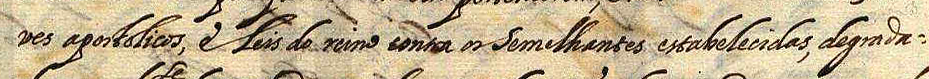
ves apostolicos, e Leis do reino contra os Semelhantes estabelecidas, degrada
